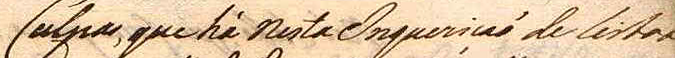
Culpas, que hà nesta Inquiziçaõ de lisboa
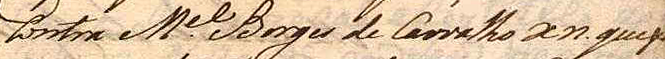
Contra M.el Borges de Carvalho x n. que f
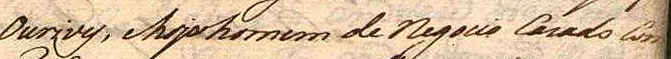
ourives, e hoje homem de negocio Cazado Com
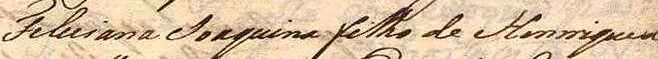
Feliciana Ioaquina filho de Henrique
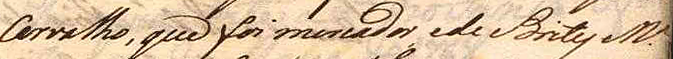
Carvalho, que foi mercador, e de Brites M.a
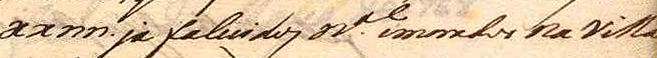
xx nn. ja falecidos n.al e morador na Villa
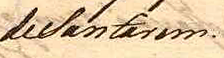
de Santarem.
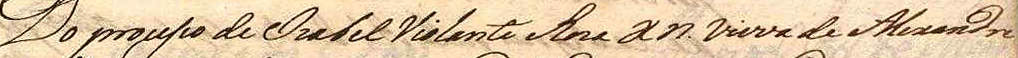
Do processo de Izabel Violante Roza x n. viuva de Alexandre
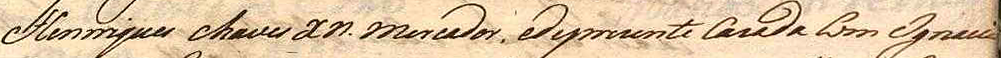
Henriques chaves x n. mercador, e de prezente Cazada Com Ignacio
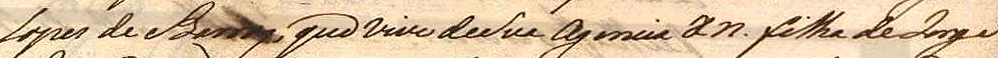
Lopes de Barros, que vive de sua Agencia x n. filha de Iorge
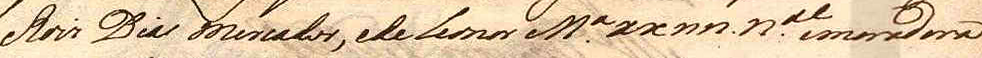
Roiz Dias Mercador, e de Leonor M.a xx nn. n.al e moradora
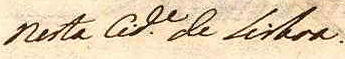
nesta Cid.e de Lisboa.
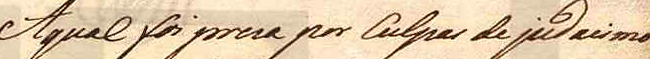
A qual foi preza por Culpas de judaismo
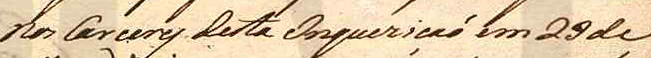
nos Carceres desta Inquiziçaõ em 29 de
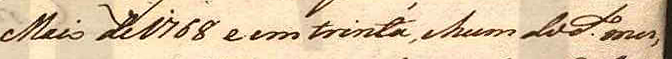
Maio de i768 e em trinta, e hum do d̄.o mes,
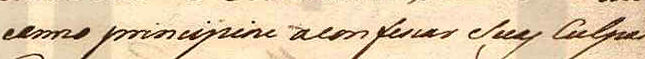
e anno principiou a confessar Suas Culpas
